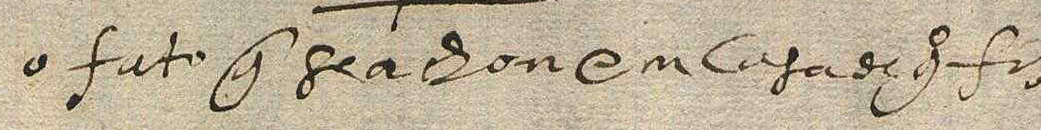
o fato q̄ se achou em casa de go frz̄
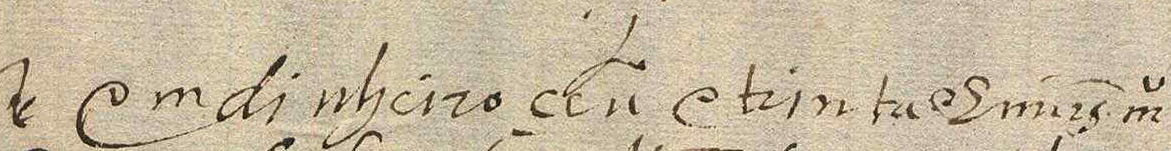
item em dinheiro cento e trinta e huū rs̄ mo
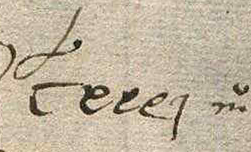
ctoxxxj mo
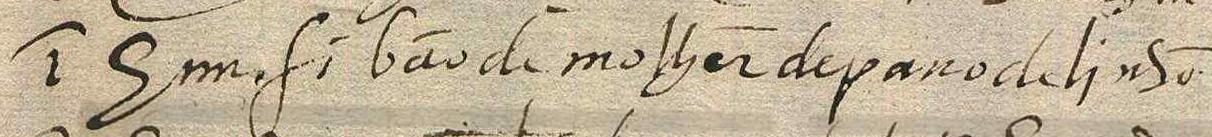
item huu Jibão de molher de pano de linho
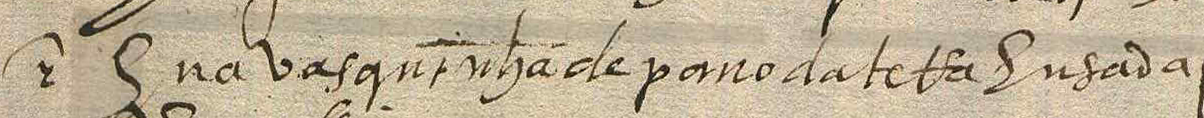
item hua vasquinha de pano da teRa husada
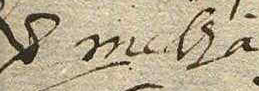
ꝟmelha
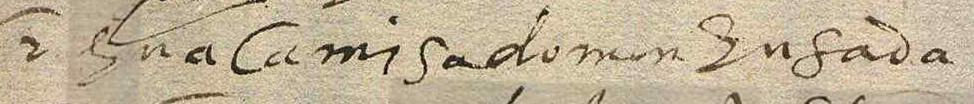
item hua Camisa domen husada
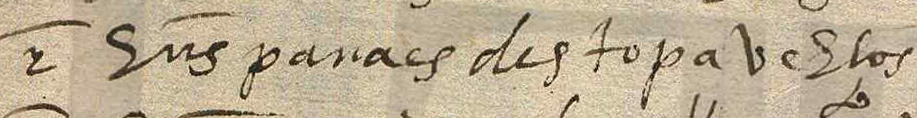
item hūs panaes destopa velhos
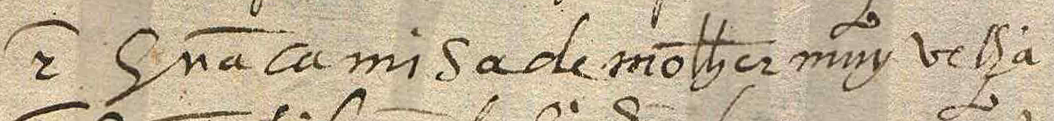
item hūa camisa de molher muyto velha
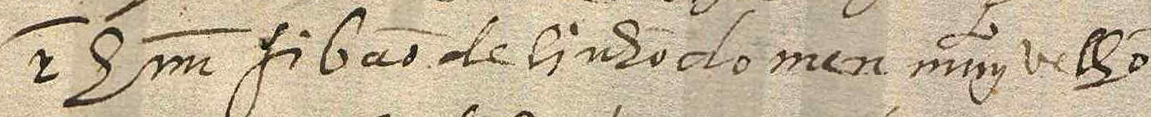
item hūu Jibão de linho domen muyto velho
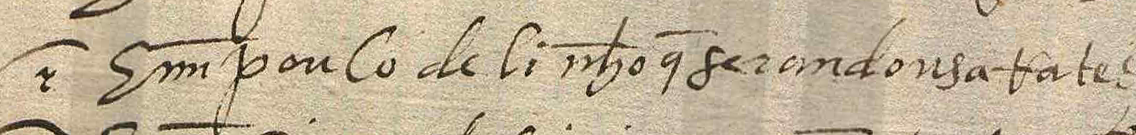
item hūu pouCo de linho q̄ seran dous aRates
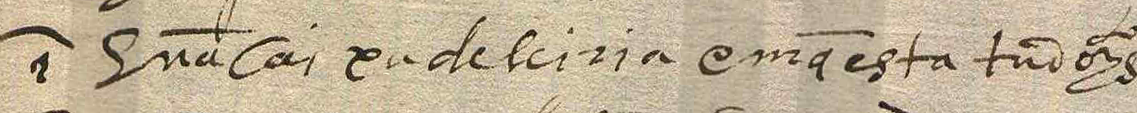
item hūa Caixa de leiria em q̄ esta tudo ysto
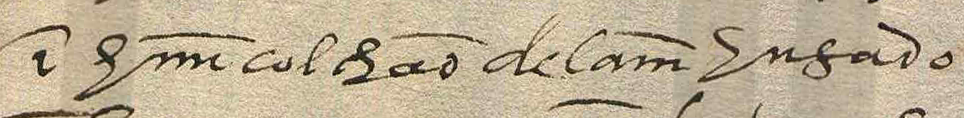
item hūu colchão de lam husado
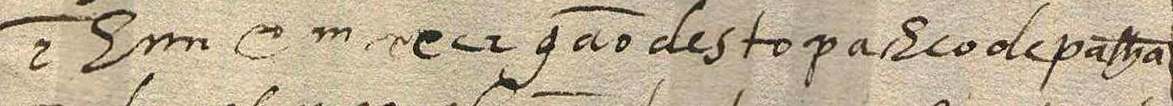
item huu emxergão destopa cheo de palha
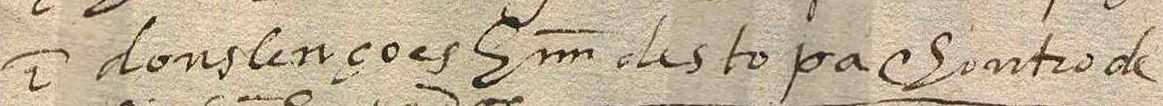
item dous lençoes hūu destopa e houtro de
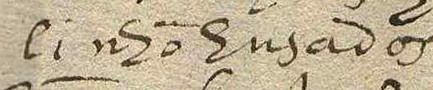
linho husados
